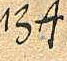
134
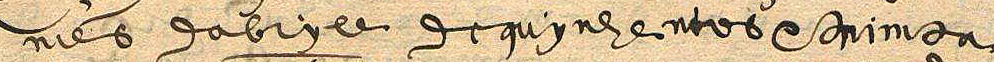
mes dabryll de quynhentos e trrimta
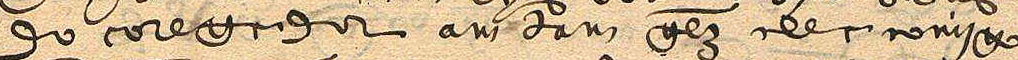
do coregedor amtam ḡlz elle comjgo
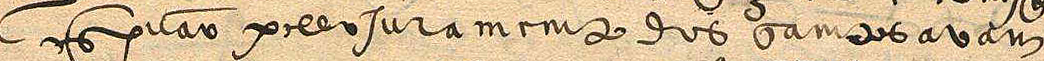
esp̄uão pello Juramemto dos samtos avam
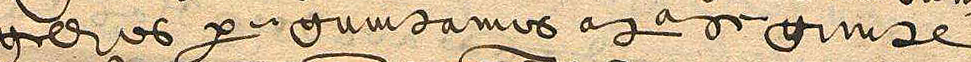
gelhos ꝑergumtamos a ta segimte
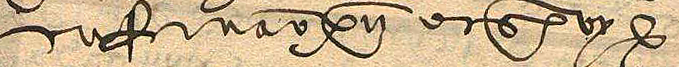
eu fernão p̄iz o esp̄vy
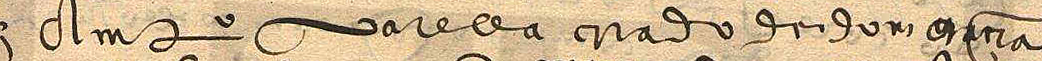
item Amto varella criado de dom graçia
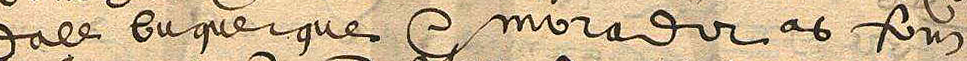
dallbuquerque e morador as fom
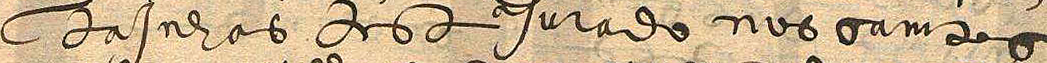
taJnhas testa Jurado nos samtos
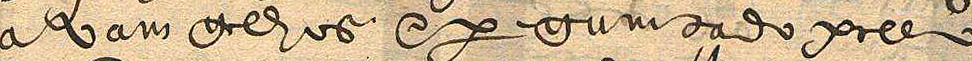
avamgelhos e ꝑegumtado pello
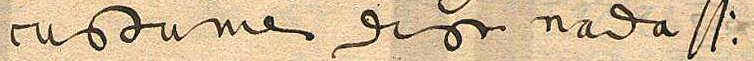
custume dise nada //:
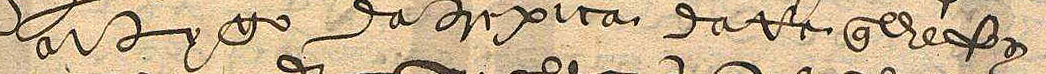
artygo da trepica da Re q̄ lhe foy
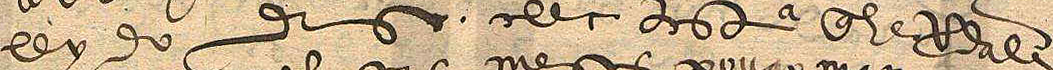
llydo dise elle testa q̄ he ꝟdade
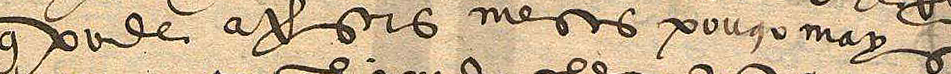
q̄ pode aꝟ seis meses pouqo mays
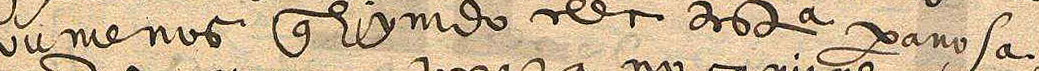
ou menos q̄ hymdo elle testa ꝑa nosa
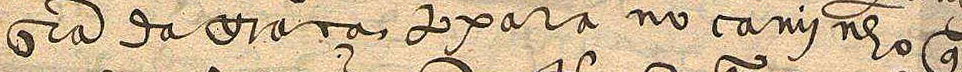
srā da graça topara no camjnho q̄
